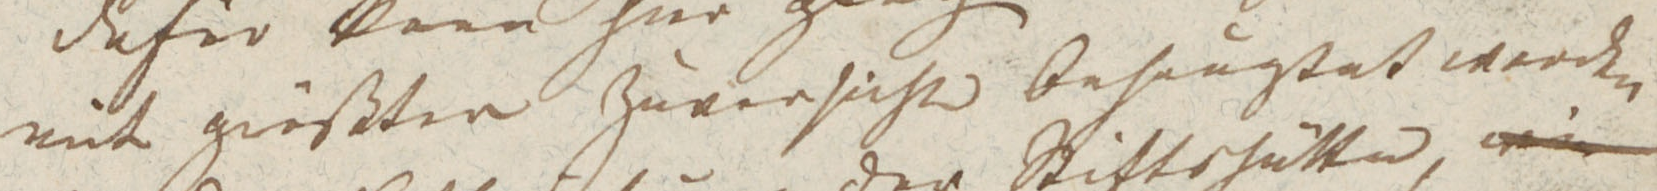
mit grösster Zuversicht behauptet werden
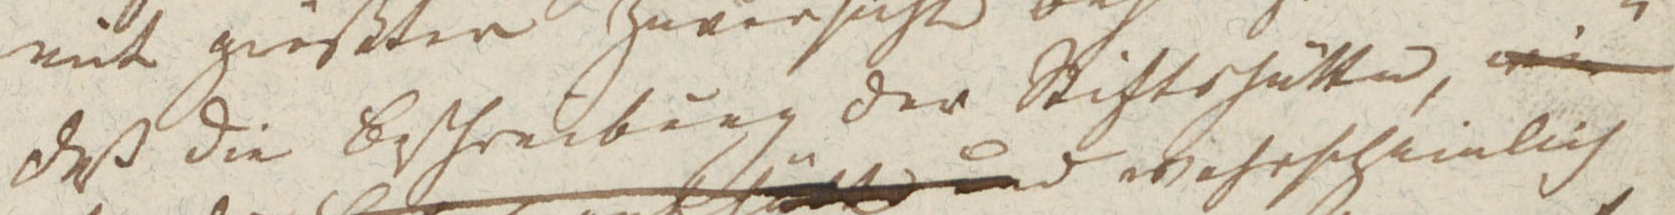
dass die Beschreibung der Stiftshütte, wie
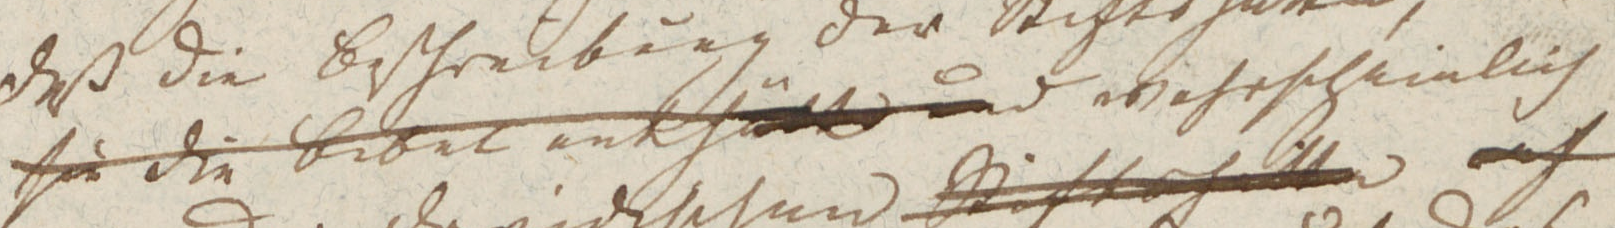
sie die Bibel enthält und wahrscheinlich
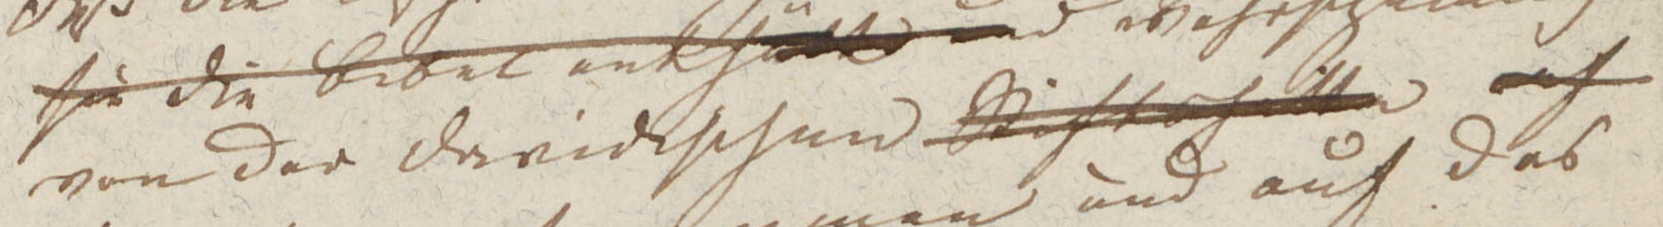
von der davidischen Stiftshütte auf
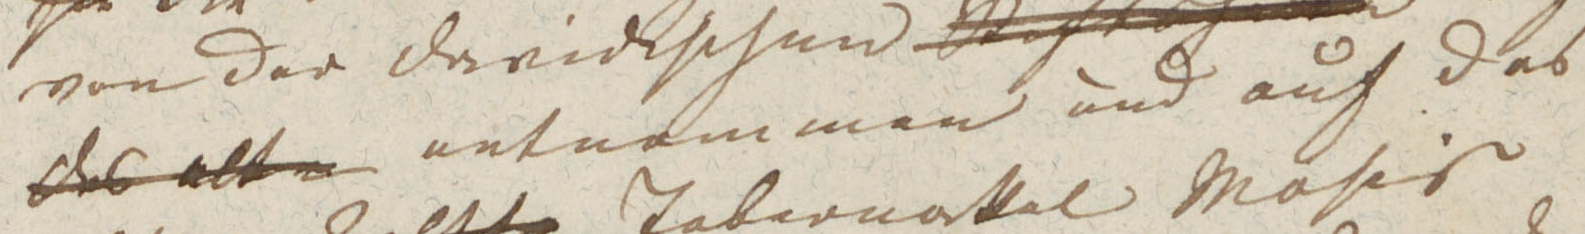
das alte entnommen und auf das
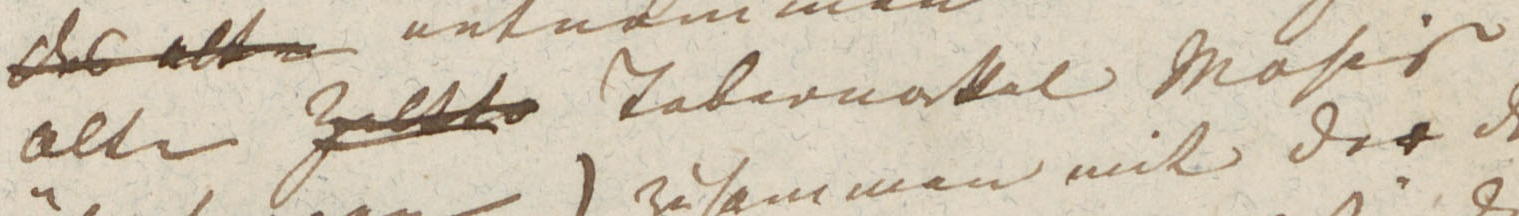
alte Zelte Tabernakel Mosis
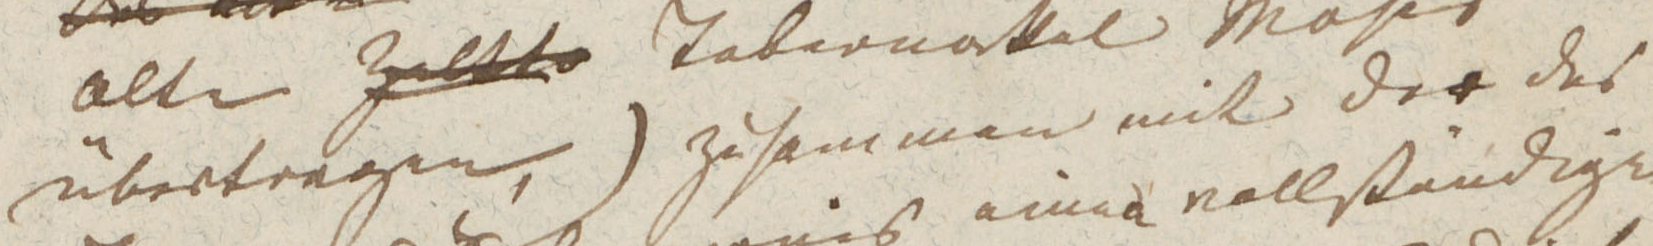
übertragen,) zusammen mit der des
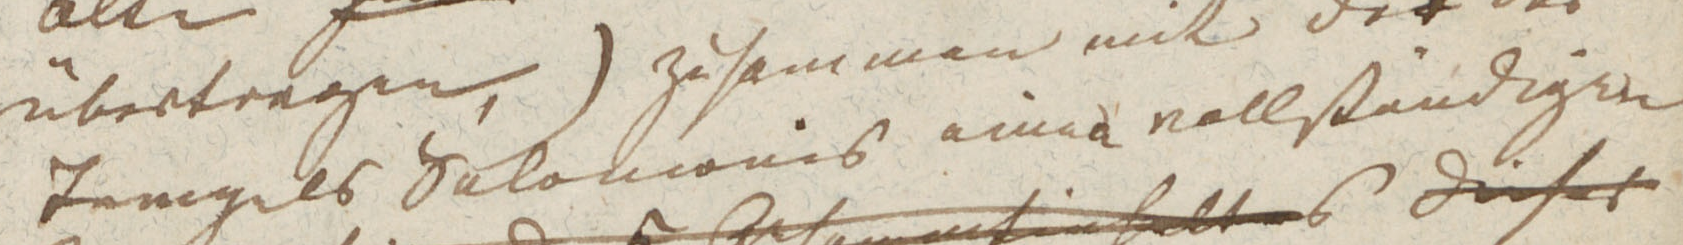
Tempels Salomonis einen vollständigen
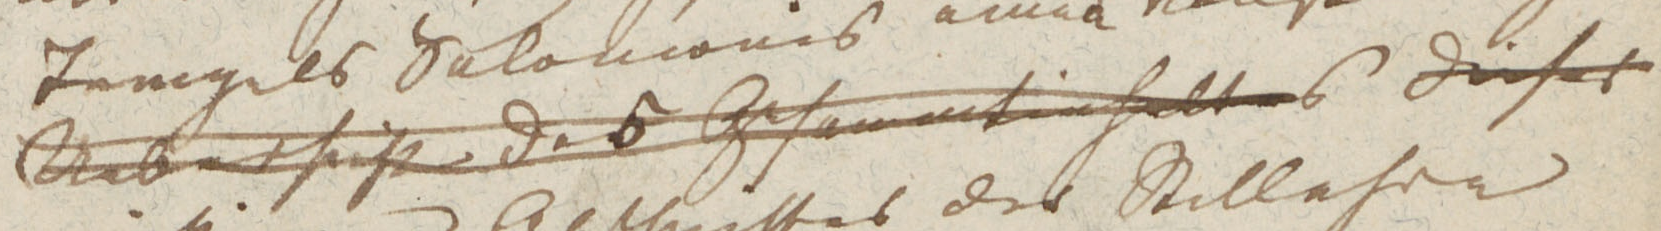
Uebersicht ders Gesammtinhaltes dieses
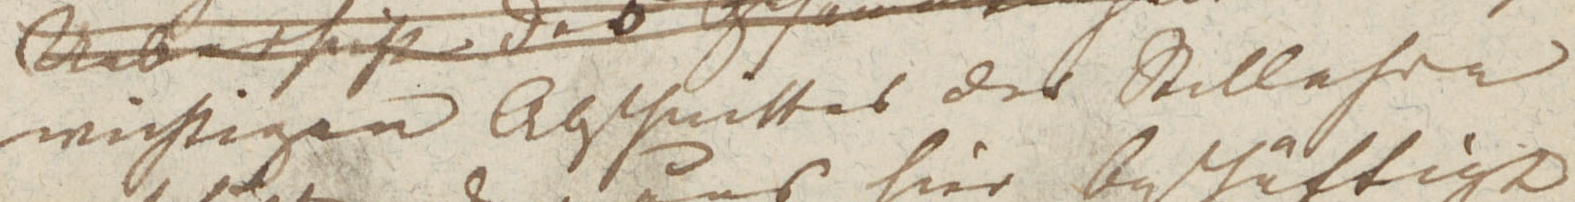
wichtigen Abschnittes der Stillehre
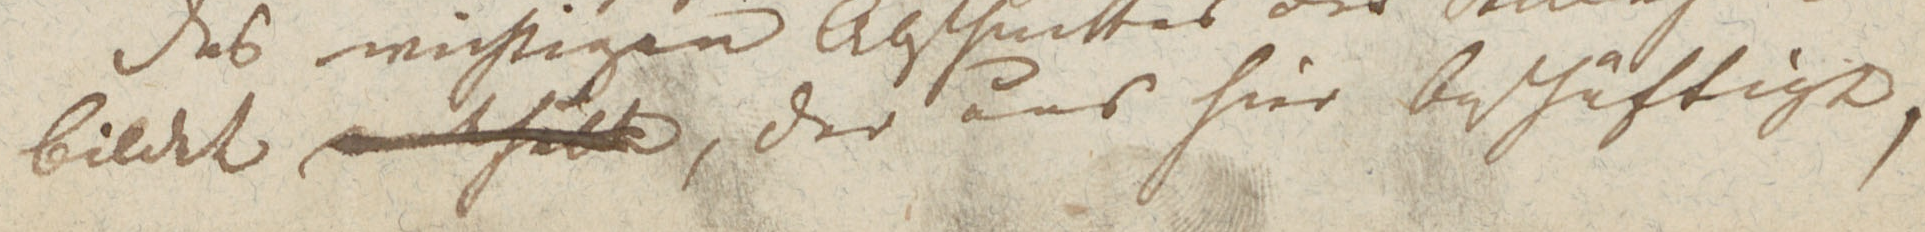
bildet enthält, der uns hier beschäftigt,
